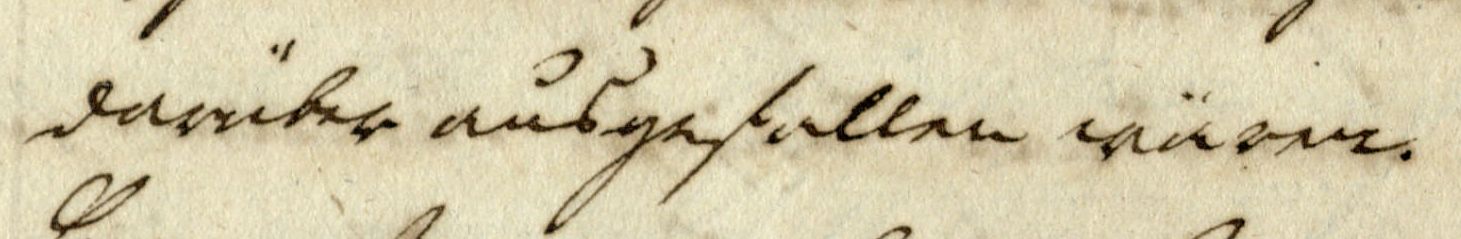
darüber ausgefallen wären.
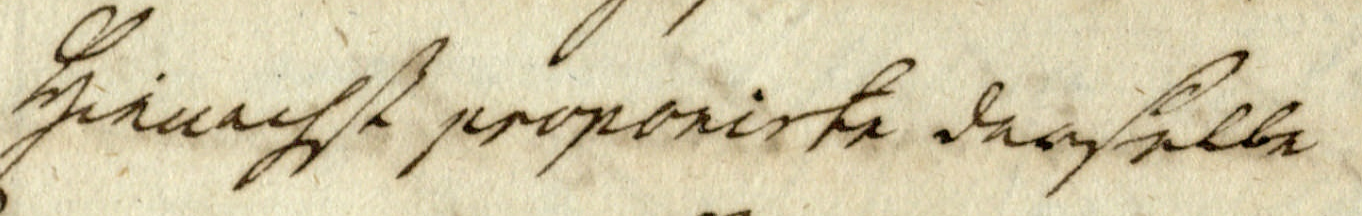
Hienechst proponirte derselbe
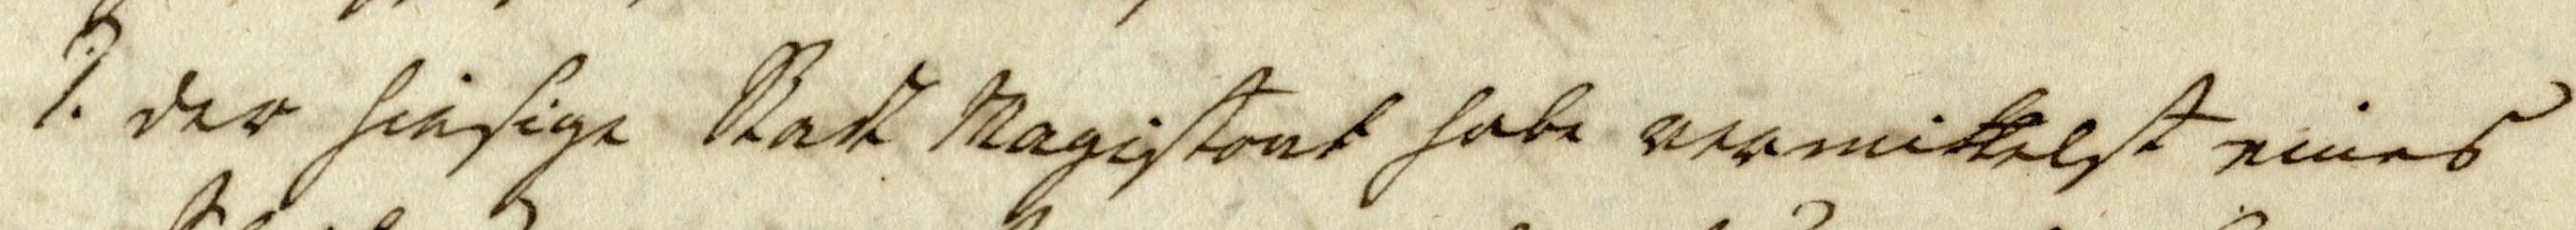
1. der hiesige Stadt Magistrat habe vermittelst eines
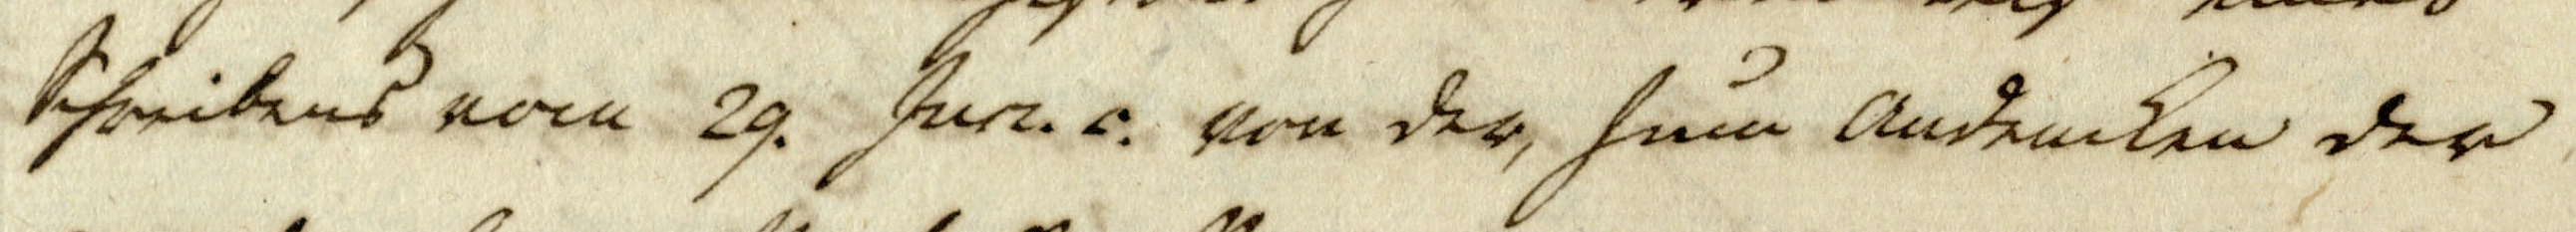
Schreibens vom 29. Jun. c. von der, zum Andencken der
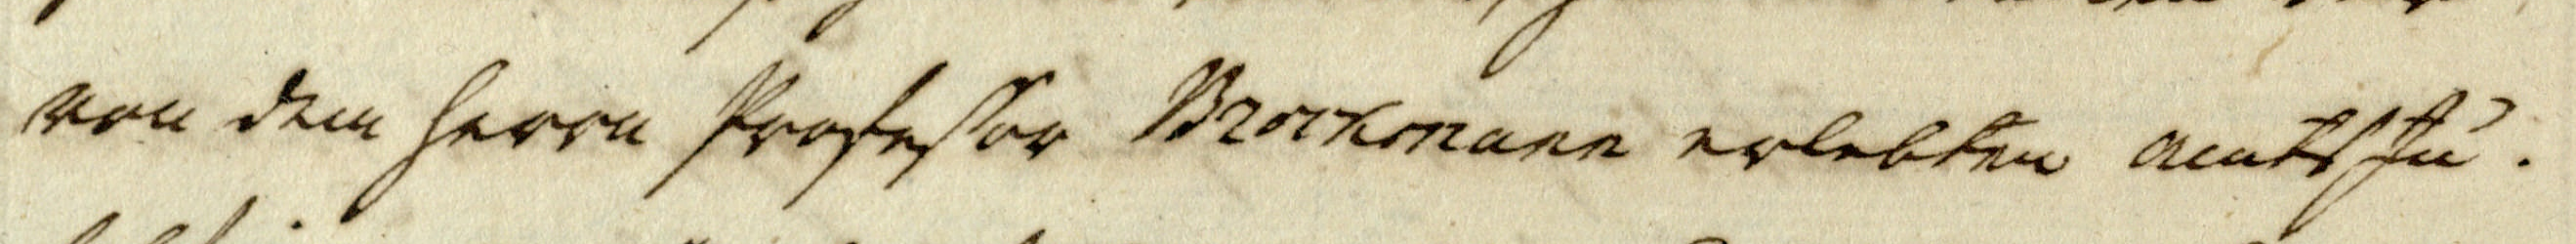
von dem herrn Professor Brockmann erlebten AmtsJu¬
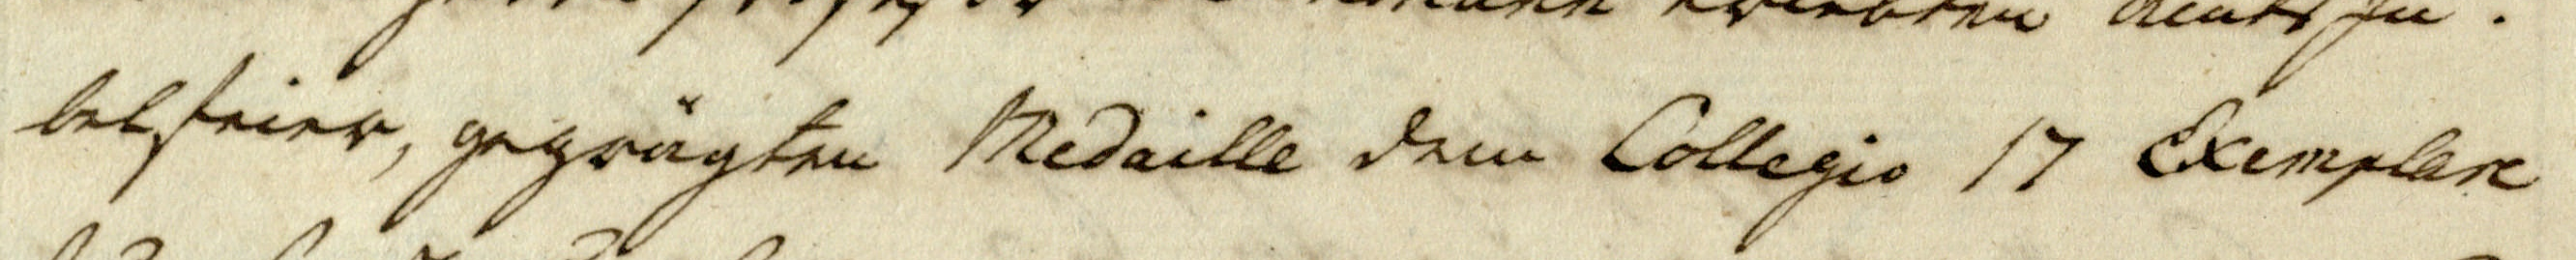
belfeier, geprägten Medaille dem Collegio 17 Exemplare
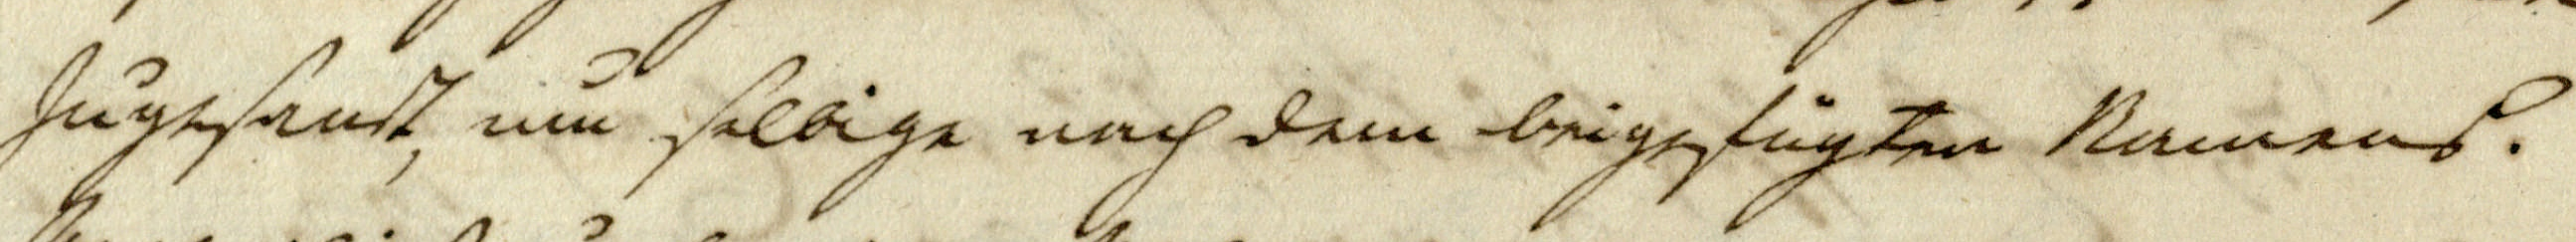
zugesandt, um selbige nach dem beigefügten Namens¬
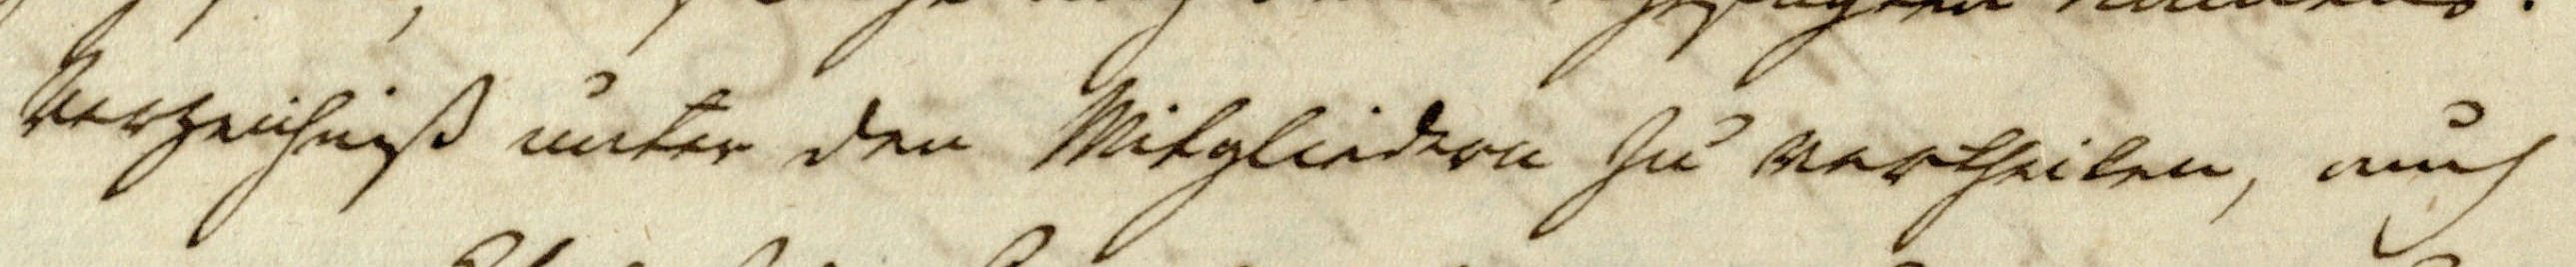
Verzeichniß unter den Mitgliedern zu vertheilen, auch
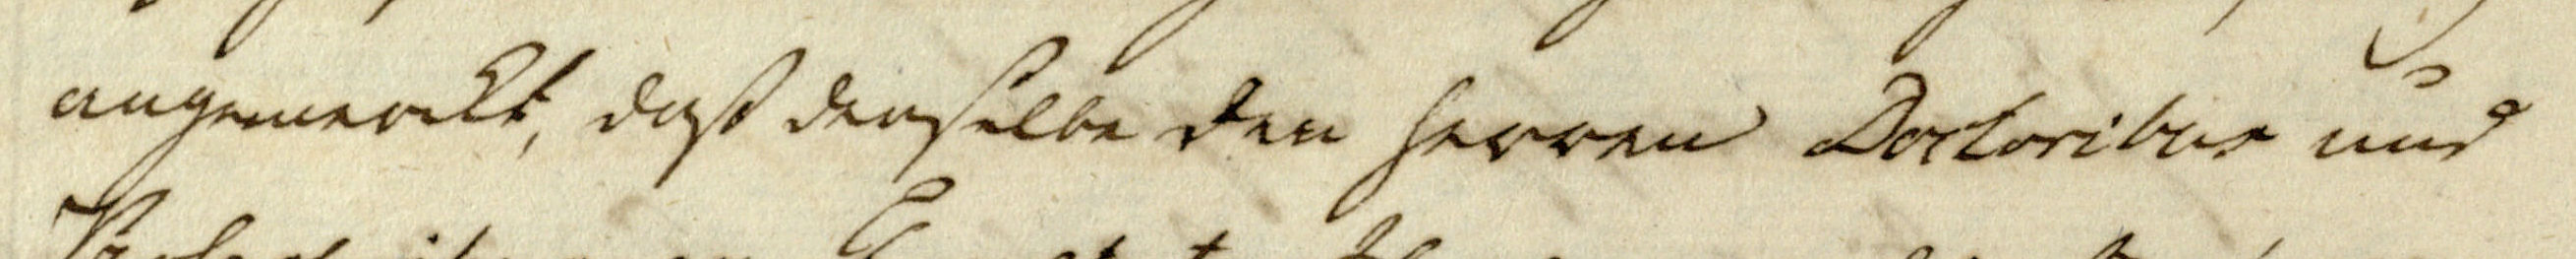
angemerckt, daß derselbe den herren Doctribus und
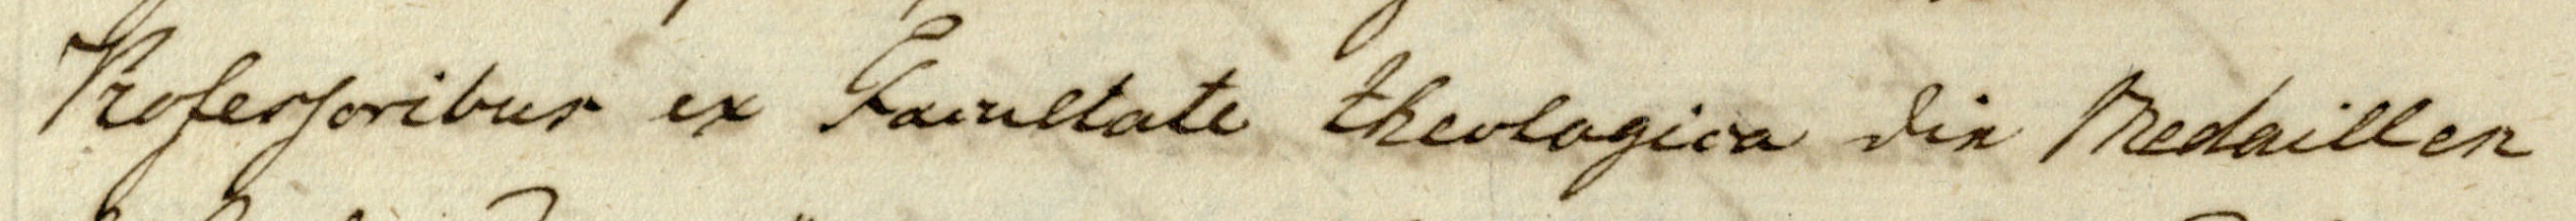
Professoribus ex Facultate theologica die Medaillen
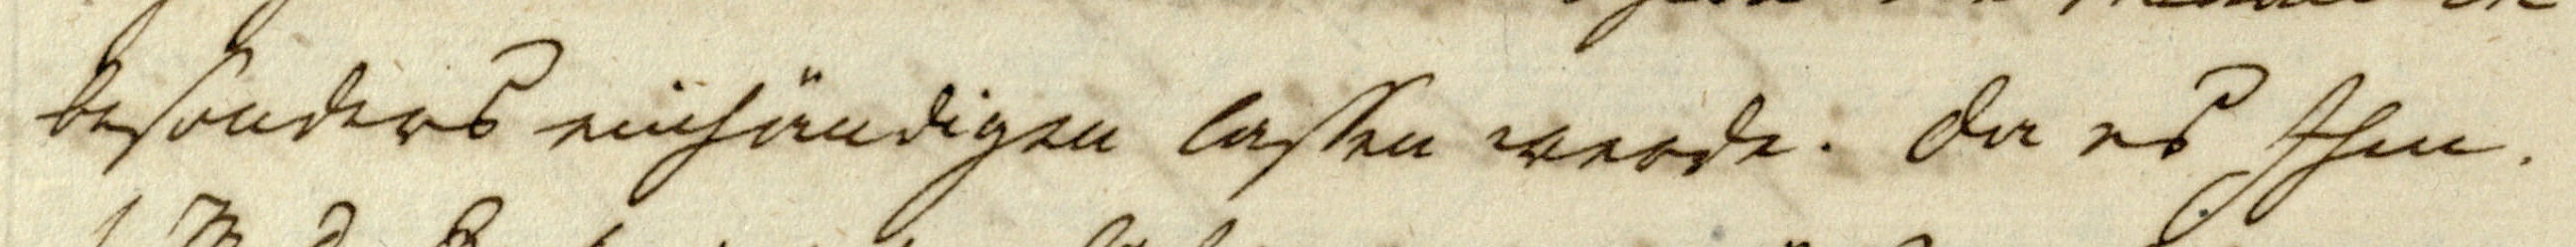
besonders einhändigen lassen werde. Da es Ihm
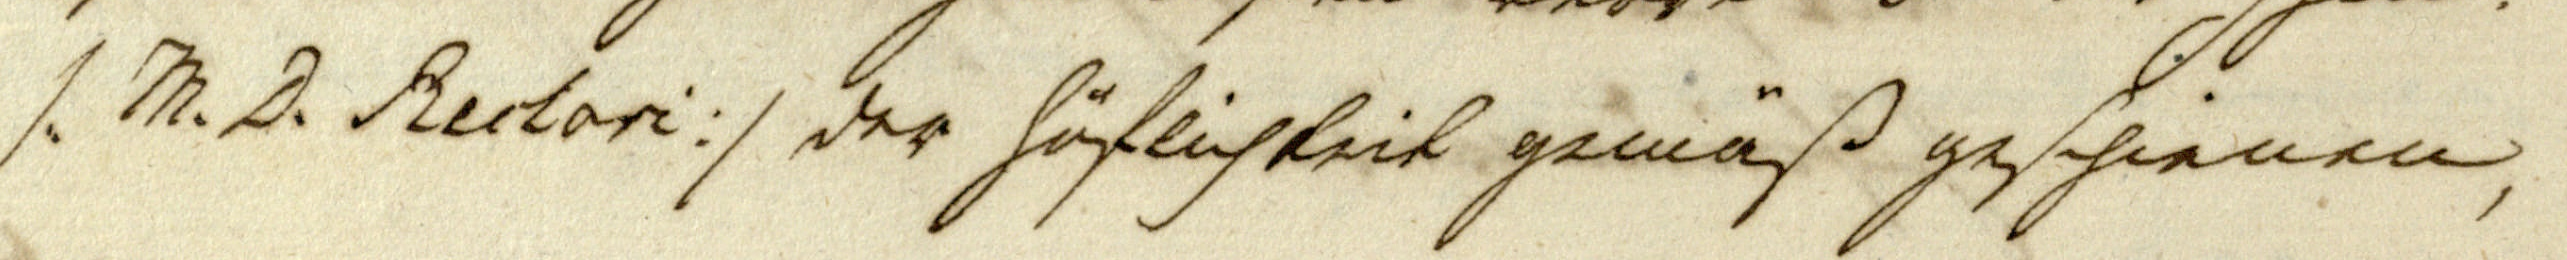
/ M. D. Rectori / der höflichkeit gemäß geschienen
